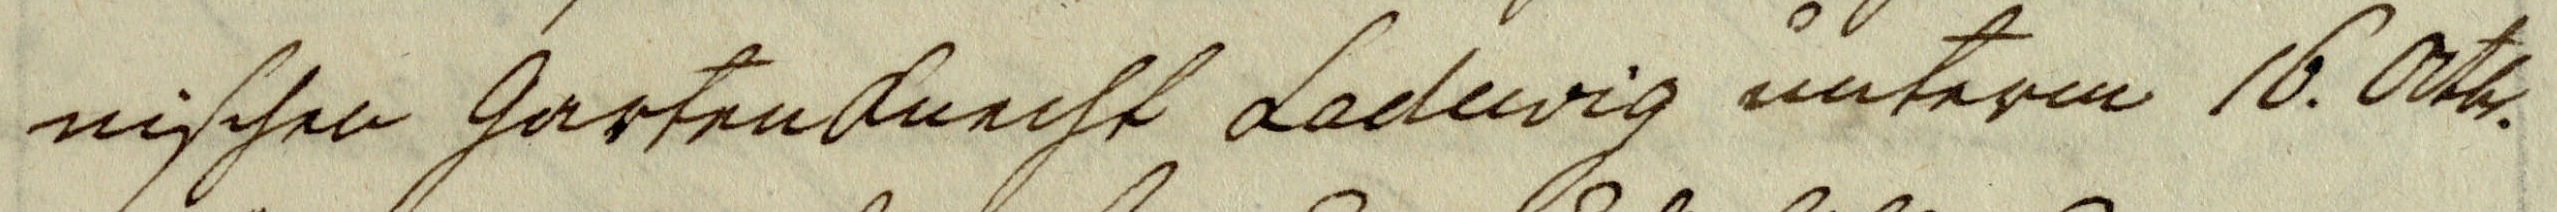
nischen Gartenknecht Ladewig unterm 16. Octbr.
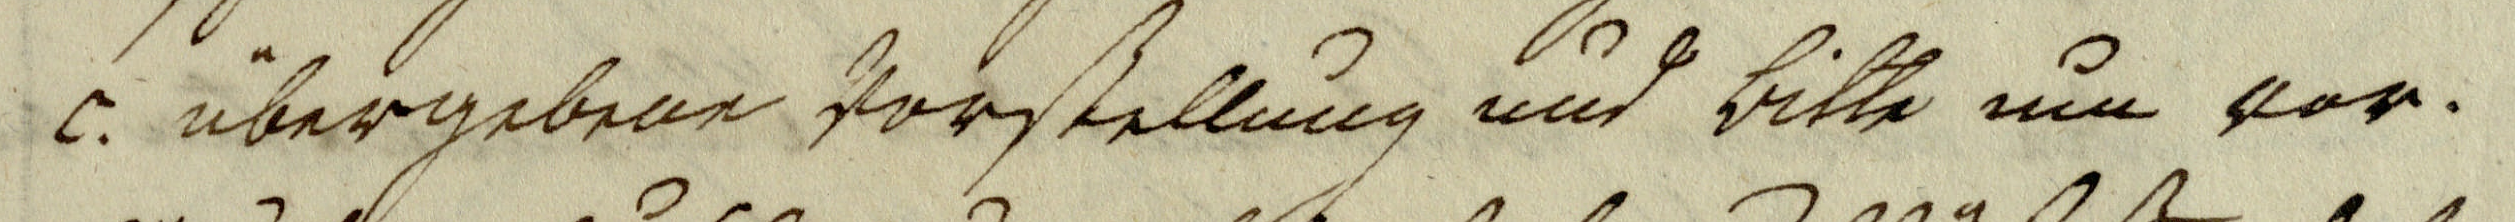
c. übergebene Vorstellung und Bitte um vor¬
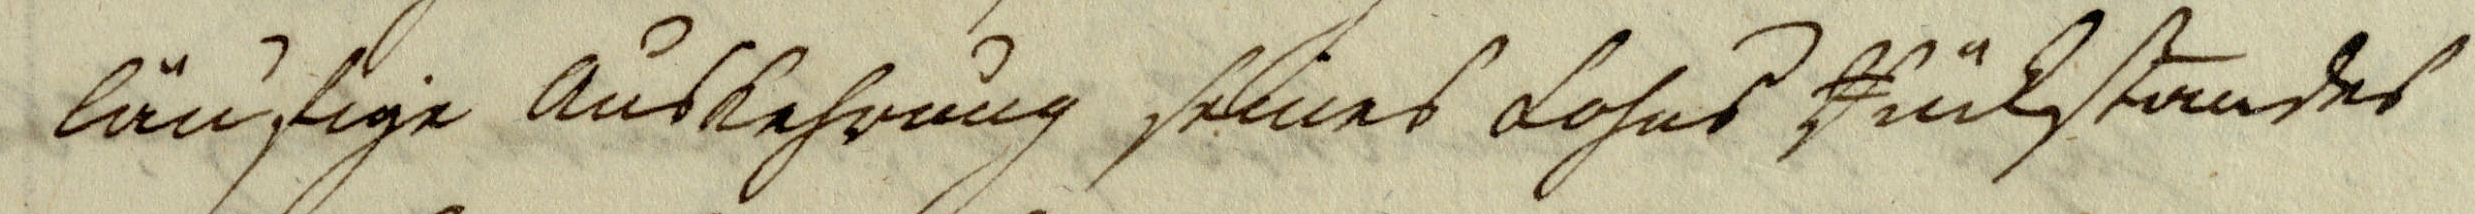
läufige Auskehrung seines Lohns Rückstandes
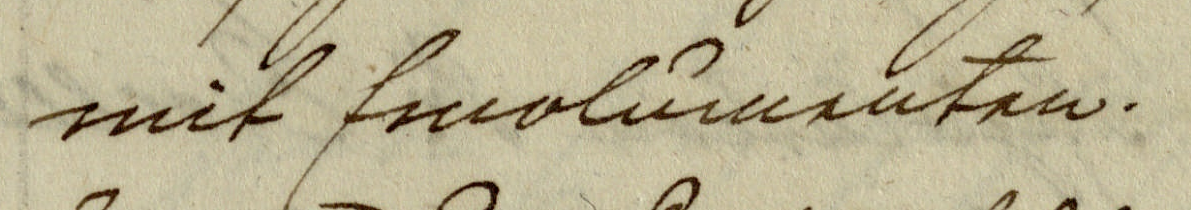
mit Emolumenten.
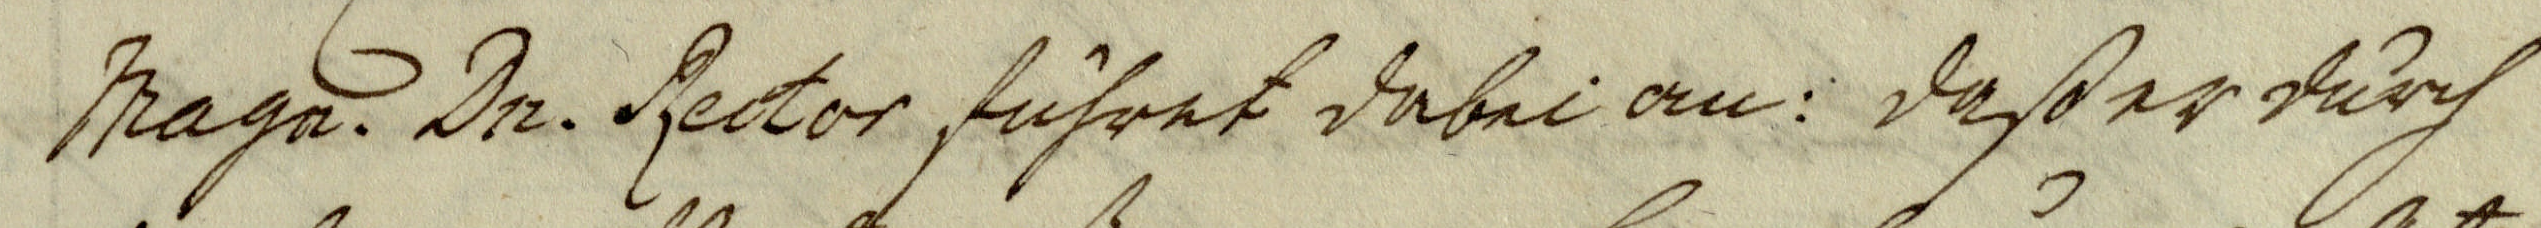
Magn. Dn. Rector führet dabei an: daß er durch
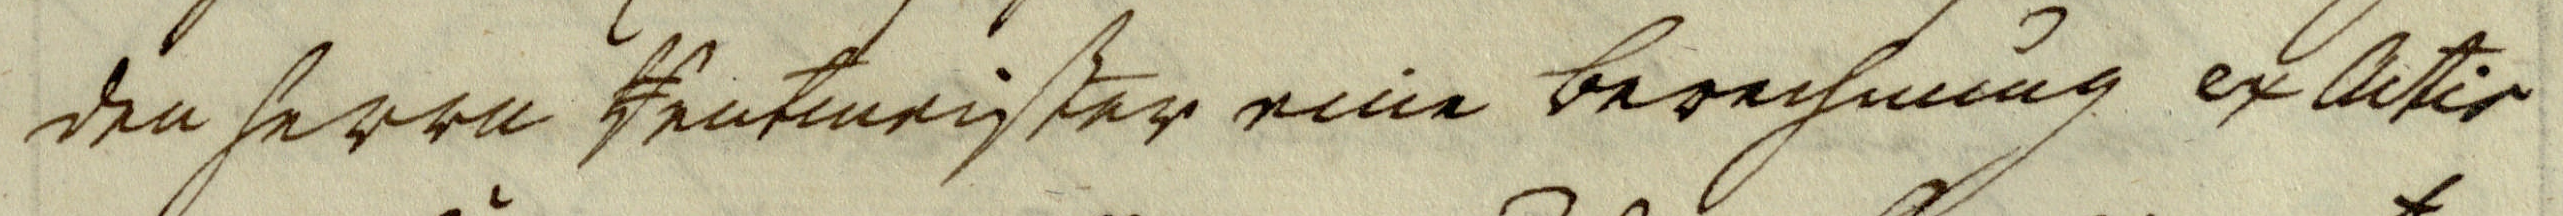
den Herrn Rentmeister eine Berechnung ex Actis
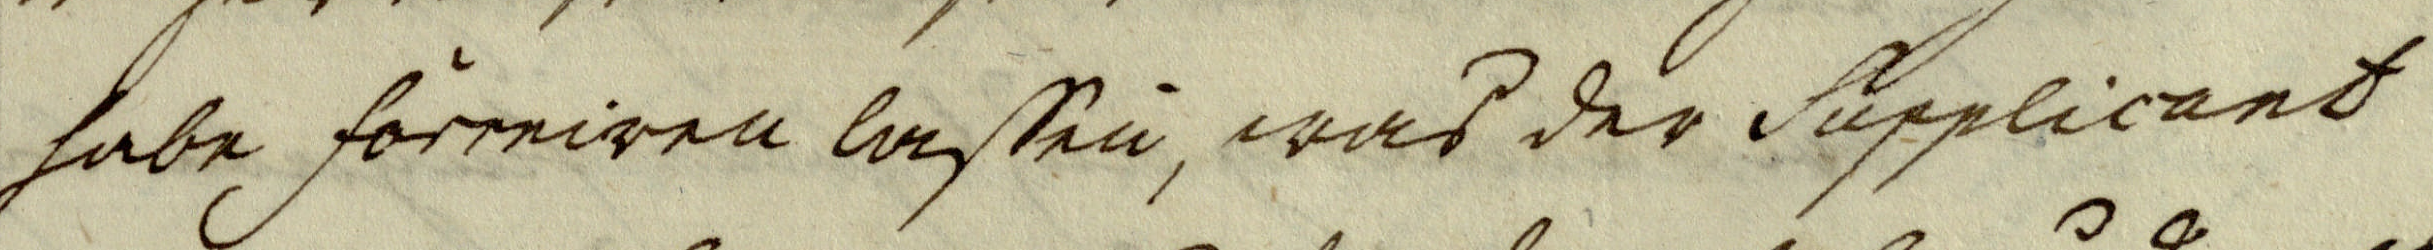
habe formiren lassen, was der Supplicant
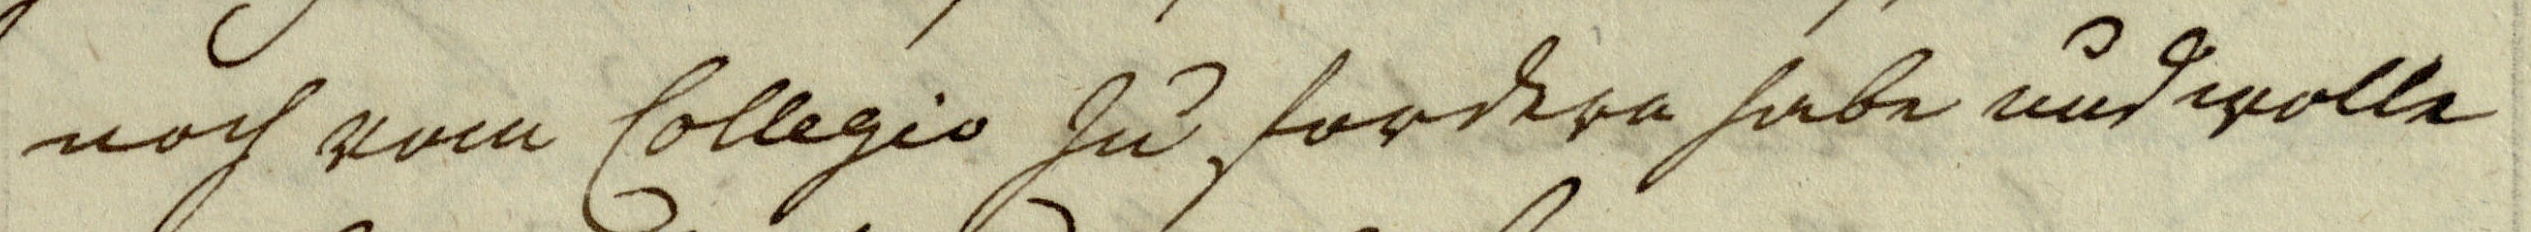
noch vom Collegio zu fordern habe und wolle
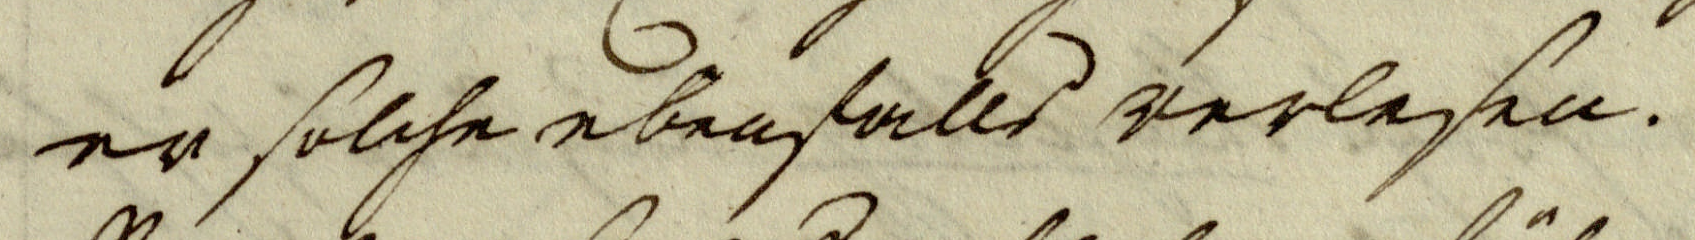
er solche ebenfalls verlesen.
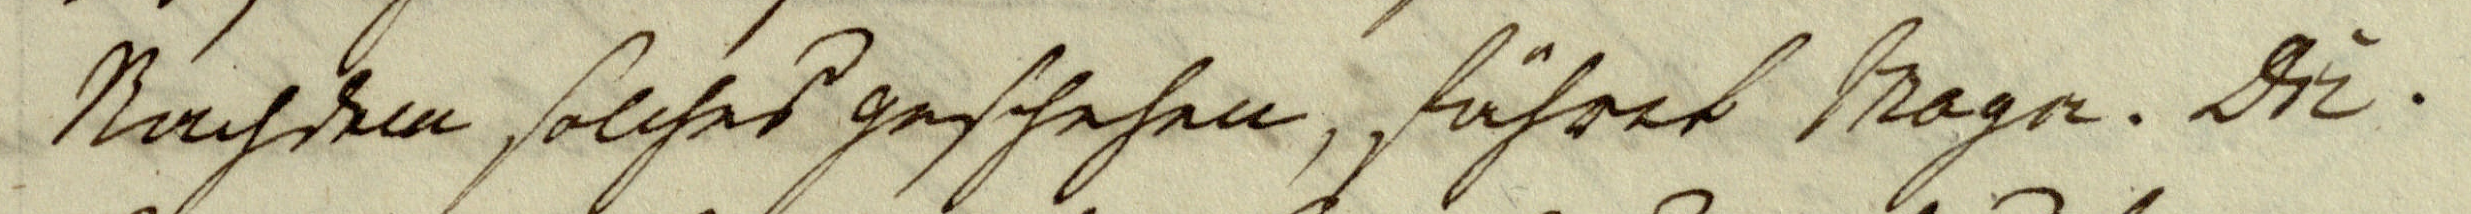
Nachdem solches geschehen, fähret Magn. Dn.
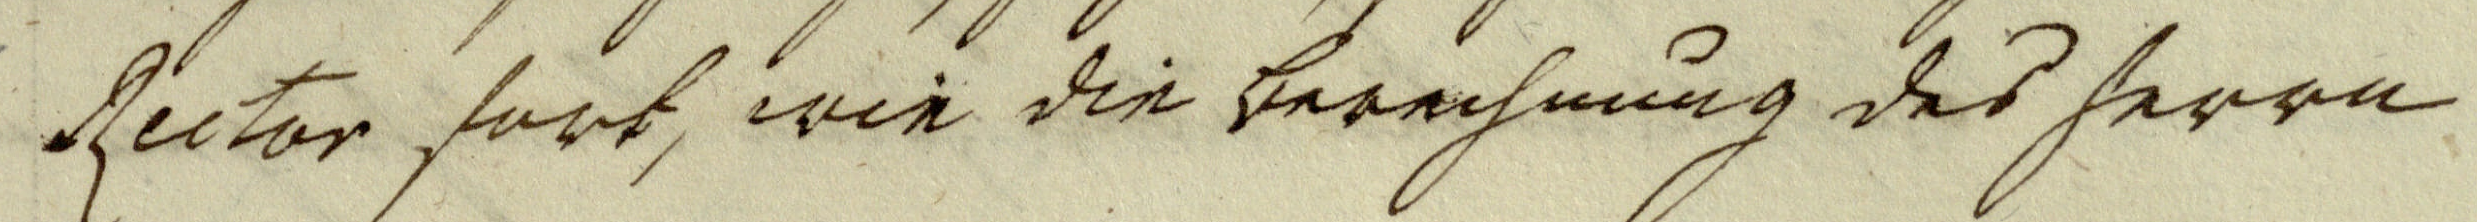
Rector, wie die Berechnung des Herrn
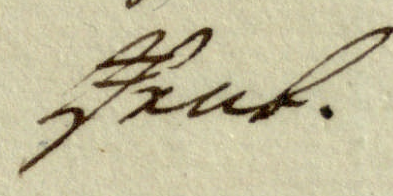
Rent¬
